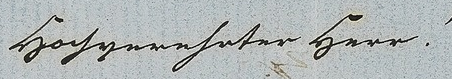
Hochverehrter Herr!
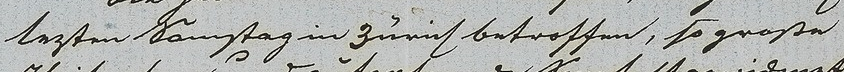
lezten Samstag in Zürich betroffen, so große
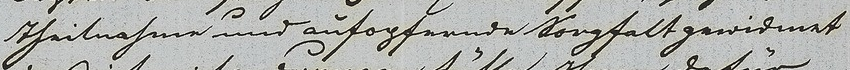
Theilnahme und aufopfernde Sorgfalt gewidmet
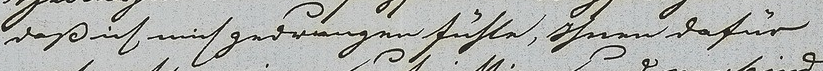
daß ich mich gedrungen fühle, Ihnen dafür
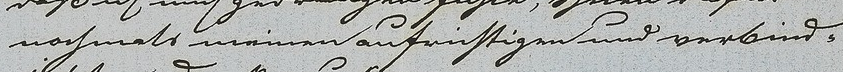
nochmals meinen aufrichtigen und verbind-
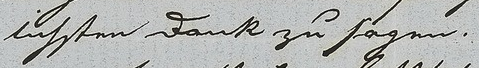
lichsten Dank zu sagen. –
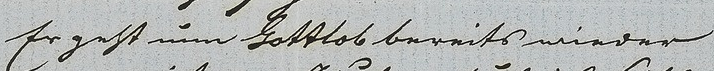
Es geht nun Gottlob bereits wieder
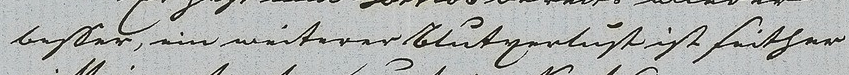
besser, ein weiterer Blutverlust ist seither
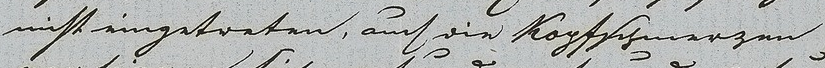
nicht eingetreten, auch die Kopfschmerzen
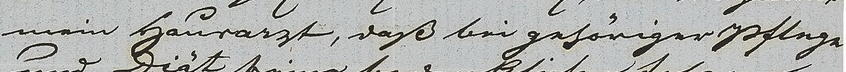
mein Hausarzt, daß bei gehöriger Pflege
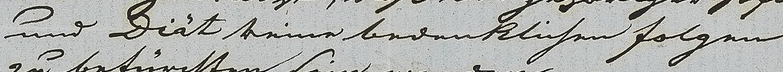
und Diät keine bedenklichen Folgen
